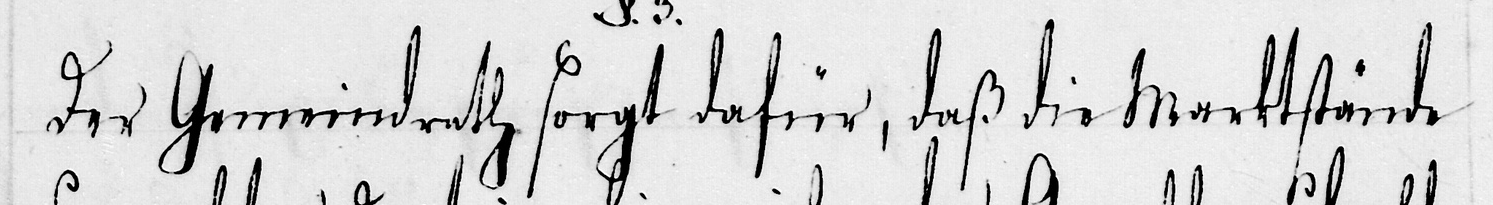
Der Gemeindrath sorgt dafür, daß die Marktstände
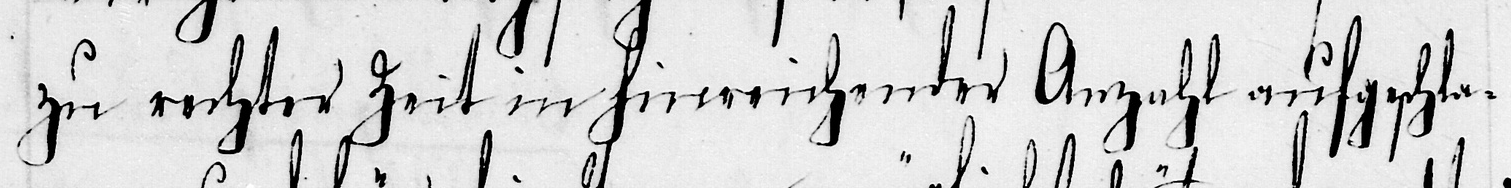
zu rechter Zeit in hinreichender Anzahl aufgeschla¬
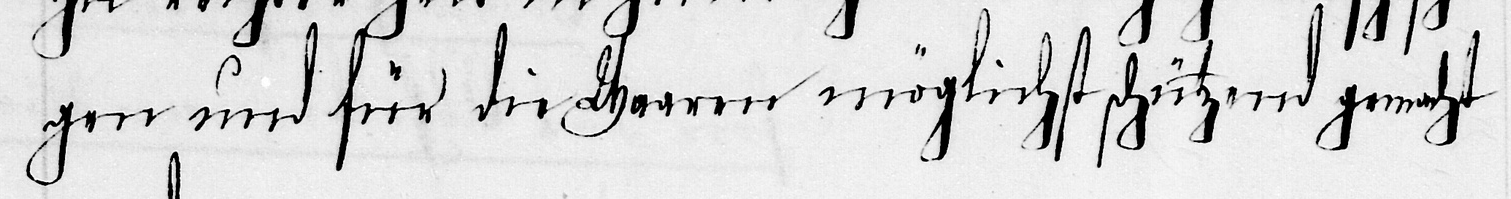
gen und für die Waaren möglichst schützend gemacht
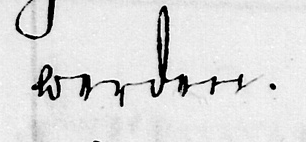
werden.
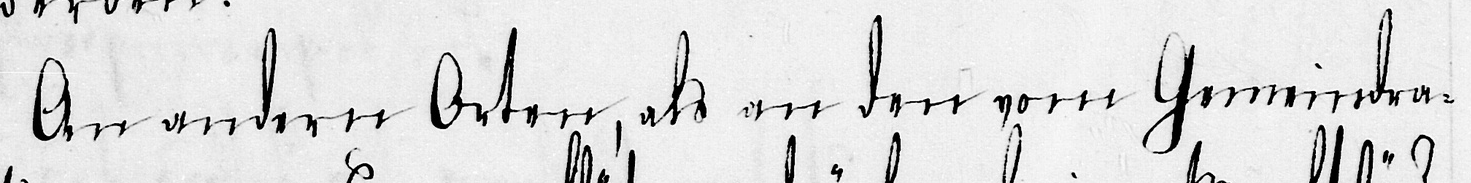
An andern Orten, als an den vom Gemeindra¬
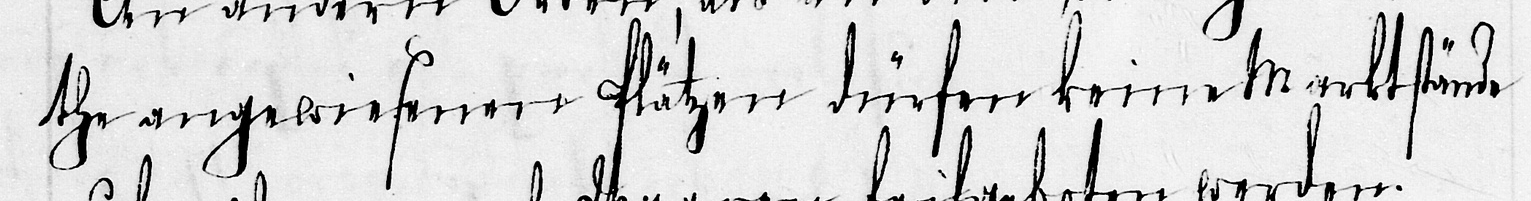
the angewiesenen Plätzen dürfen keine Marktstände
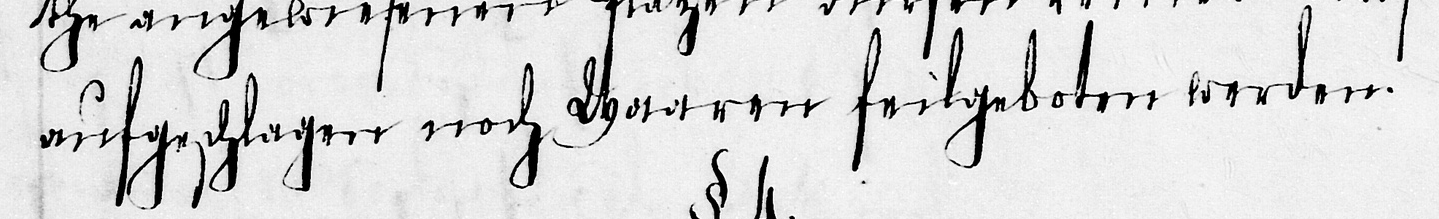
aufgeschlagen noch Waaren feilgeboten werden.
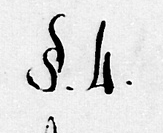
§. 4.
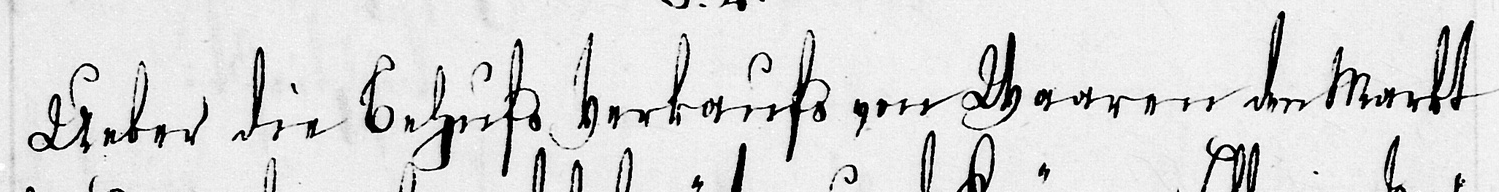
Ueber die Behufs Verkaufs von Waaren den Markt
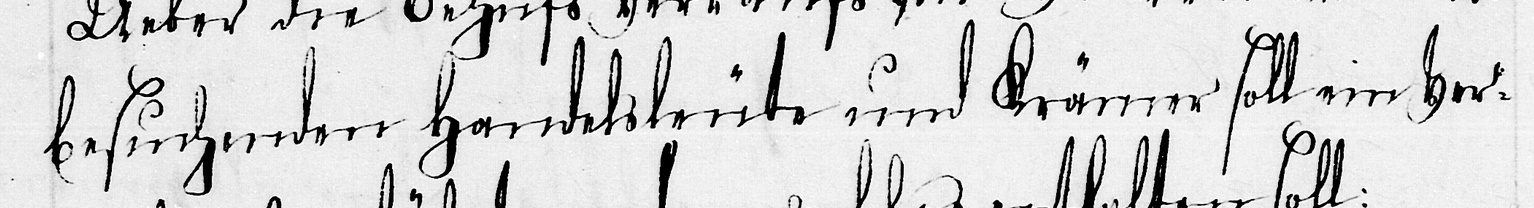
besuchenden Handelsleute und Krämer soll ein Ver¬
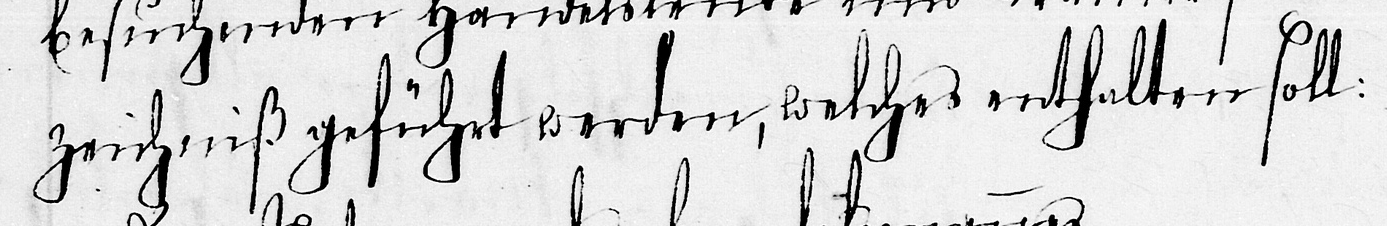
zeichniß geführt werden, welches enthalten soll:
